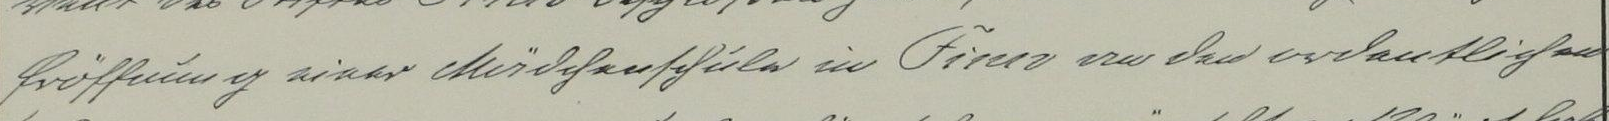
Eröffnung einer Mädchenschule in Finn an den ordentlichen
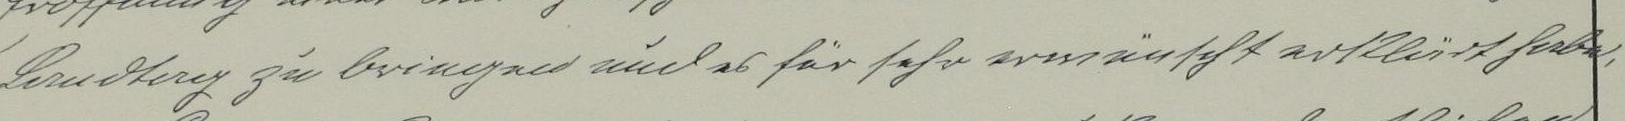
Landtag zu bringen und es für sehr erwünscht erklärt habe,
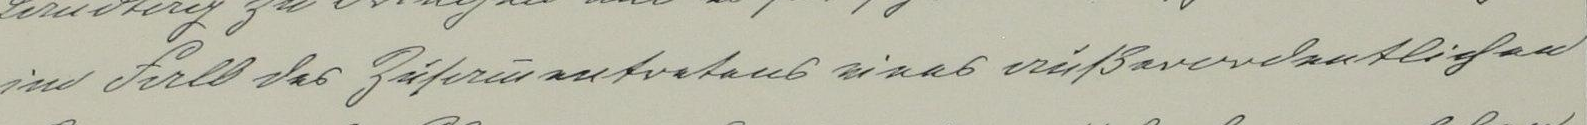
im Fall des Zusammentretens eines außerordentlichen
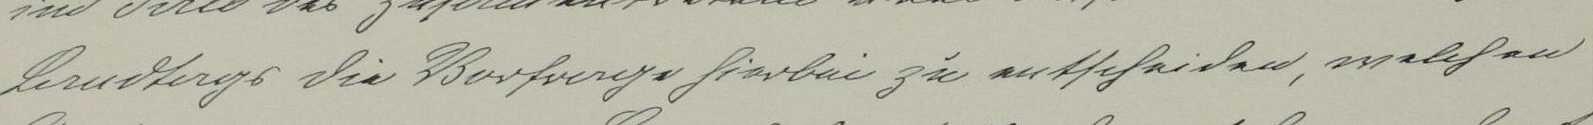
Landtags die Vorfrage hierbei zu entscheiden, welchen
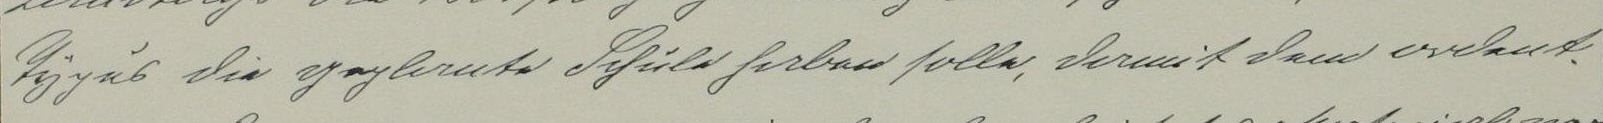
Typus die geplante Schule haben solle, damit dem ordent-
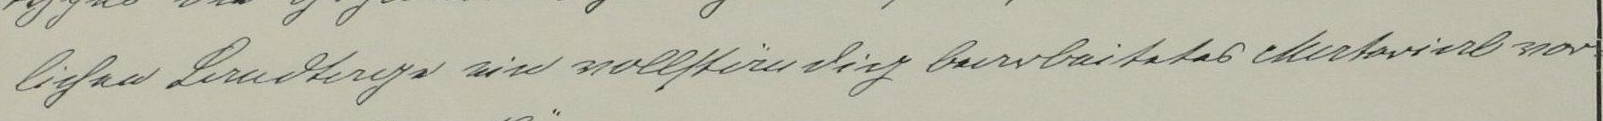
lichen Landtage ein vollständig bearbeitetes Material vor-
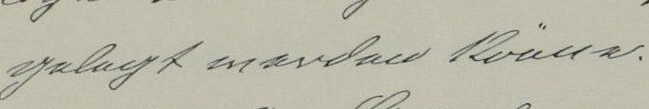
gelegt werden könne.
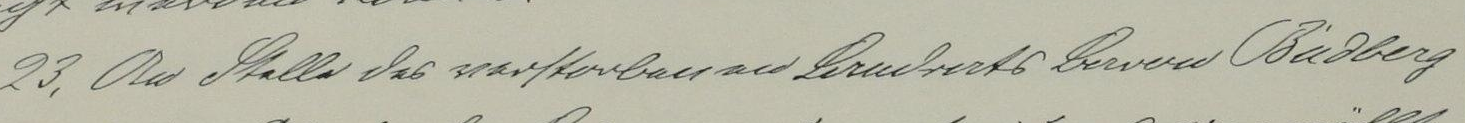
23. An Stelle des verstorbenen Landrats Baron Budberg
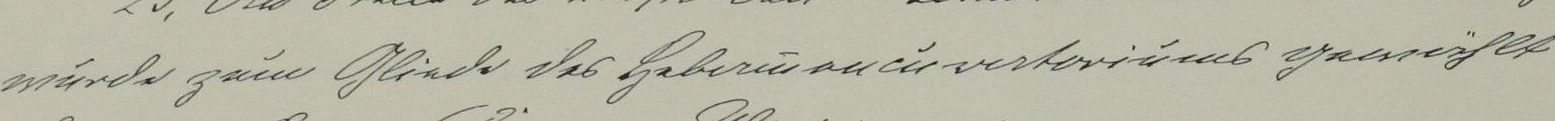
wurde zum Gliede des Hebammencuratoriums gewählt
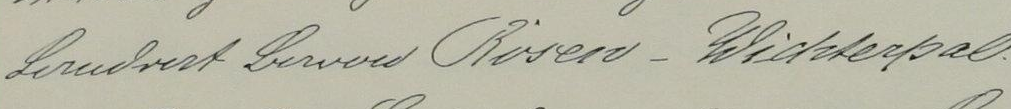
Landrat Baron Rosen-Wichterpal.
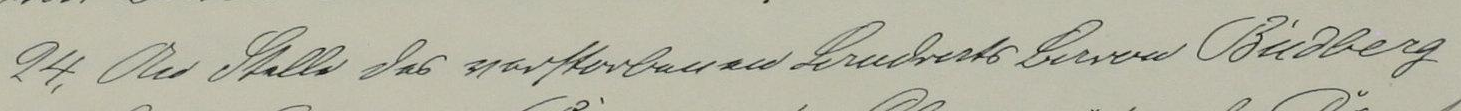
24. An Stelle des verstorbenen Landrats Baron Budberg
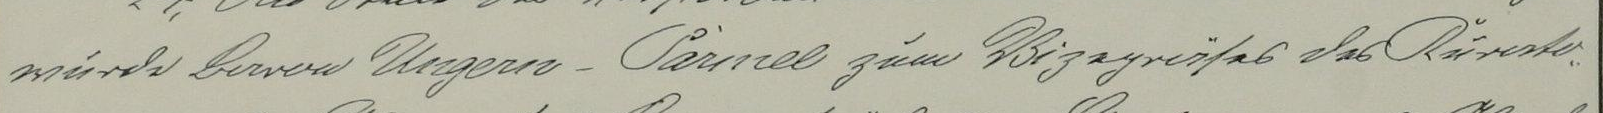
wurde Baron Ungern-Parmel zum Vizepräses des Kurato-
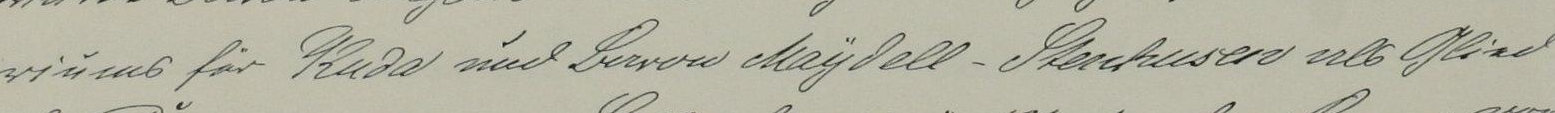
riums für Kuda und Baron Maydell-Stenhusen als Glied
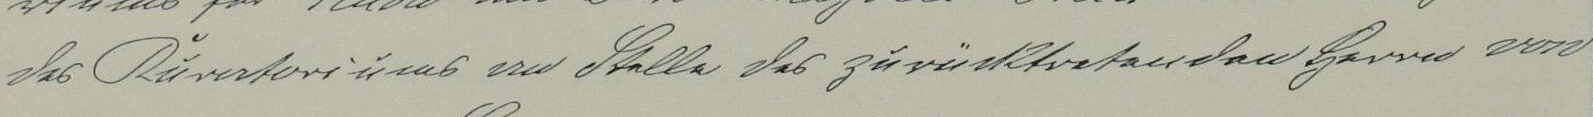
des Kuratoriums an Stelle des zurücktretenden Herrn von
